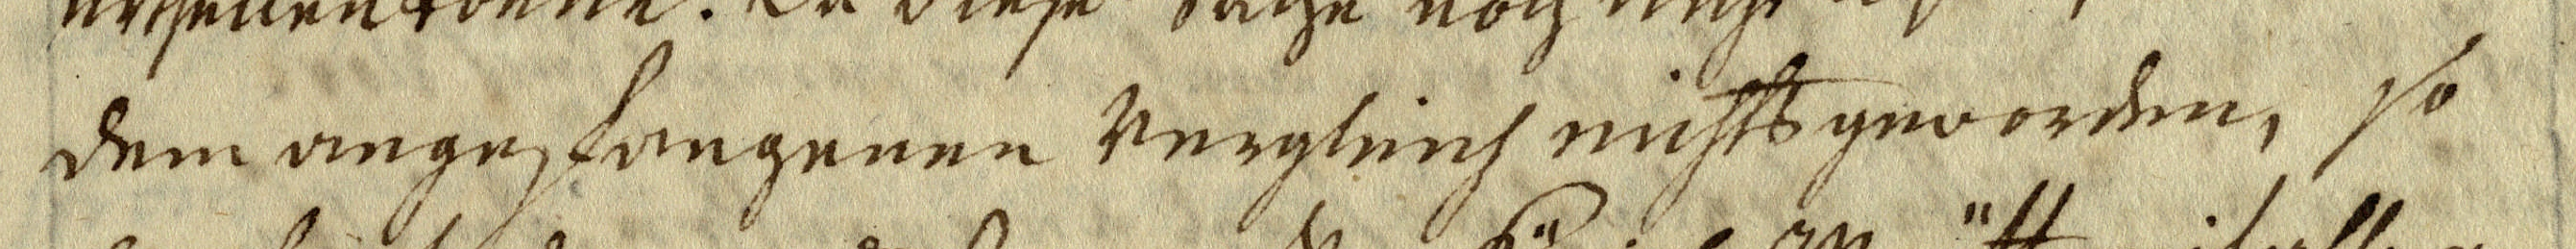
dem angefangenen Vergleich nichts geworden, so
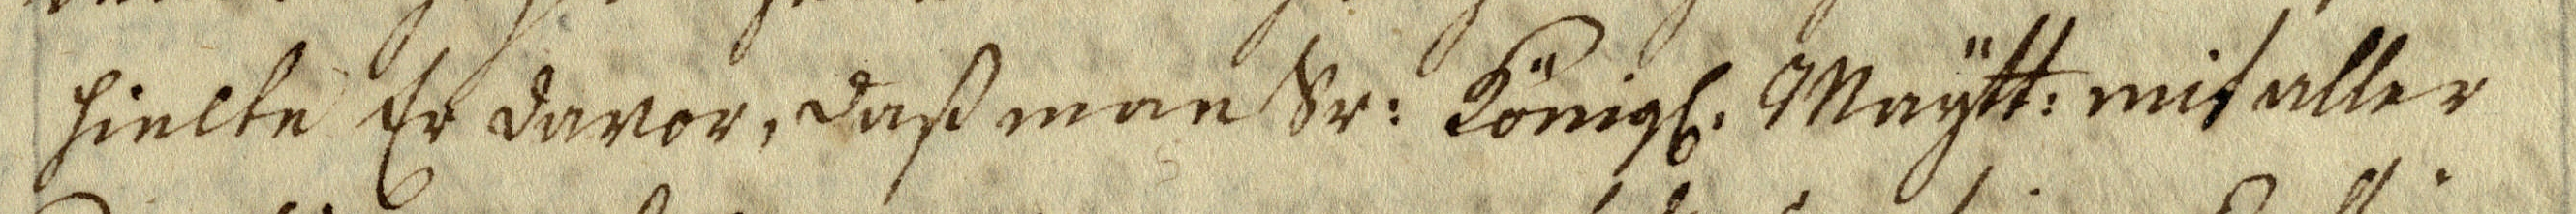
hielte Er davor, daß man Sr. Königl. Maÿtt. mit aller
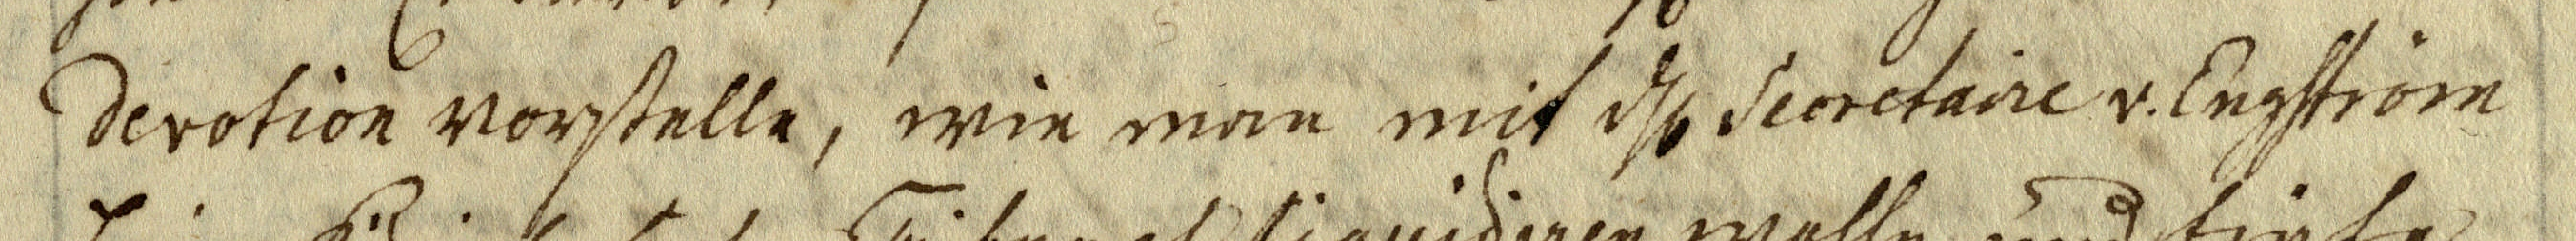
devotion vorstelle, wie man mit dh. Secretaire v. Engström
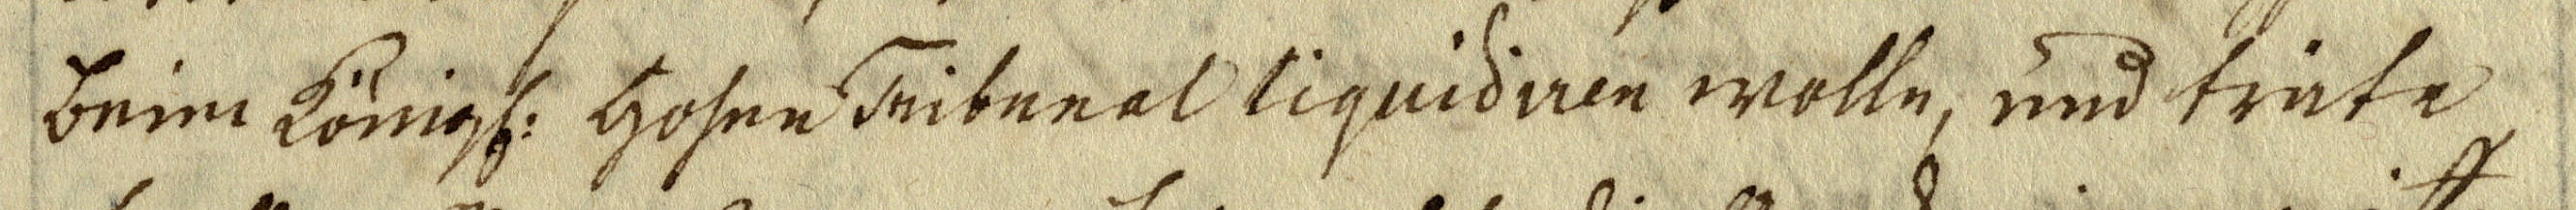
beim Königl. Hohen Tribunal liquidiren wolle, und träte
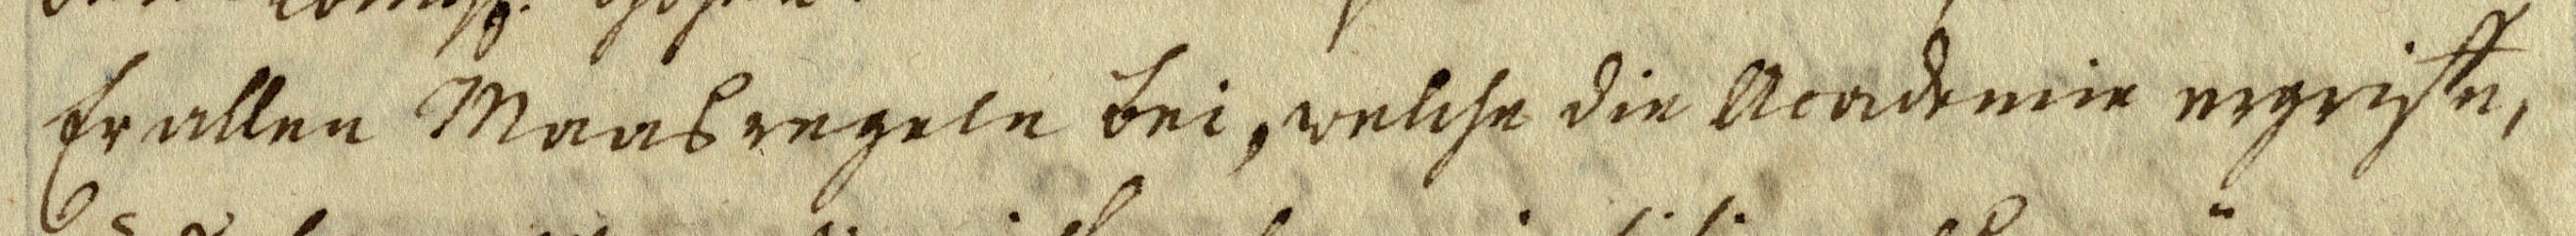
Er allen Maasregeln bei, welche die Academie ergriffe,
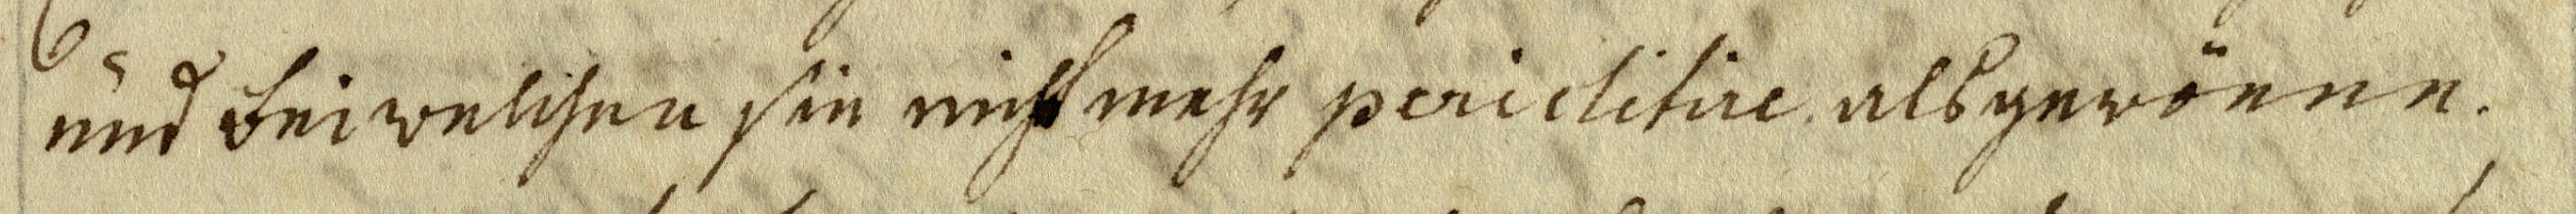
und bei welchen sie nicht mehr periclitire als gewönne.
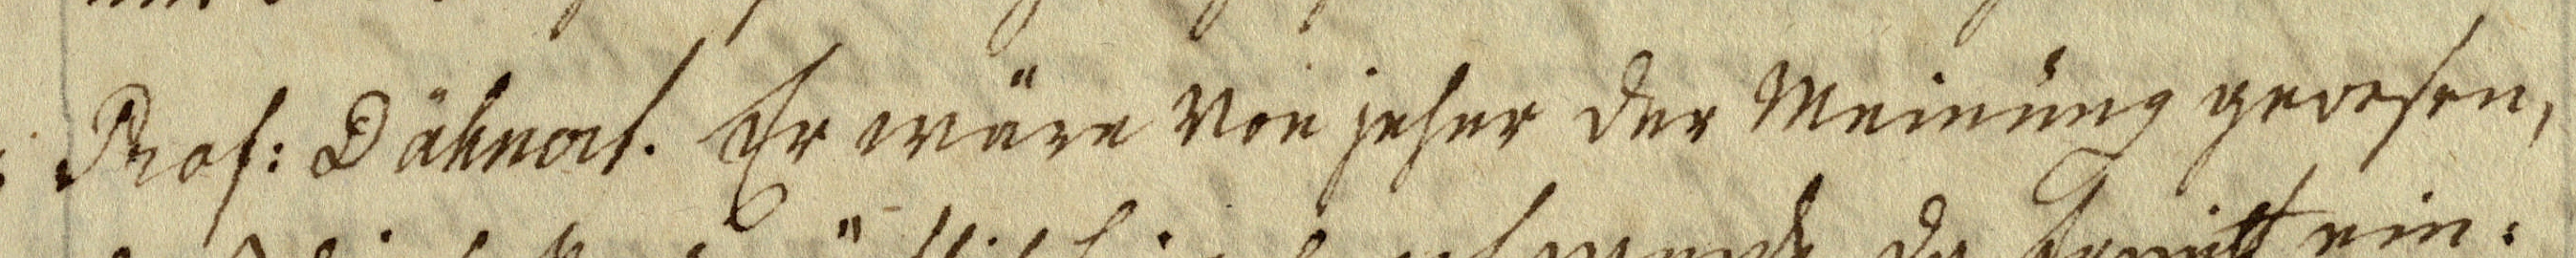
dh Prof. Dähnert. Er wäre von jeher der Meinung gewesen,
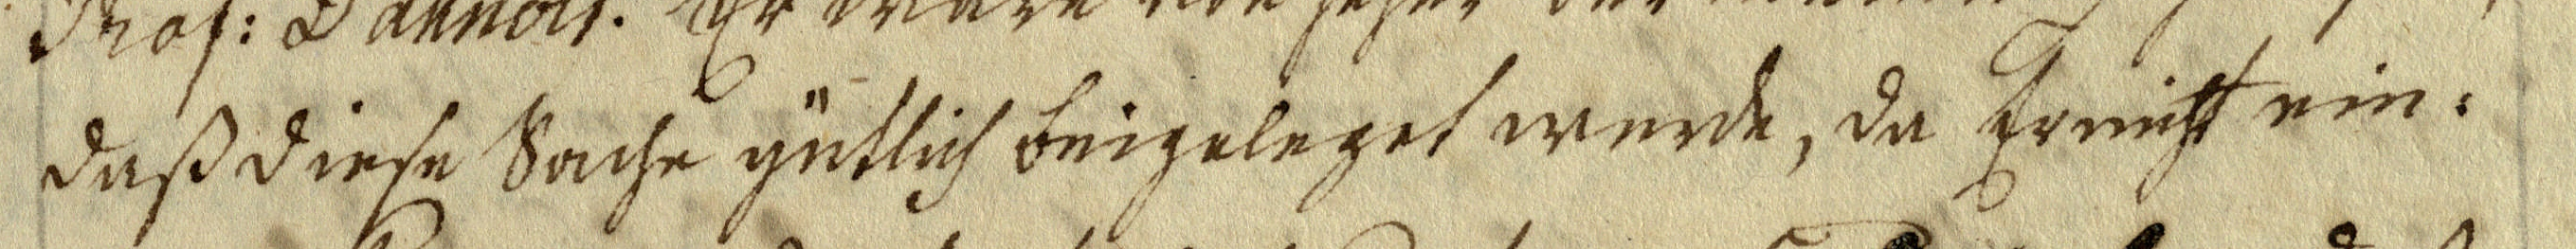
daß diese Sache gütlich beigelegt werde, da Er nicht ein¬
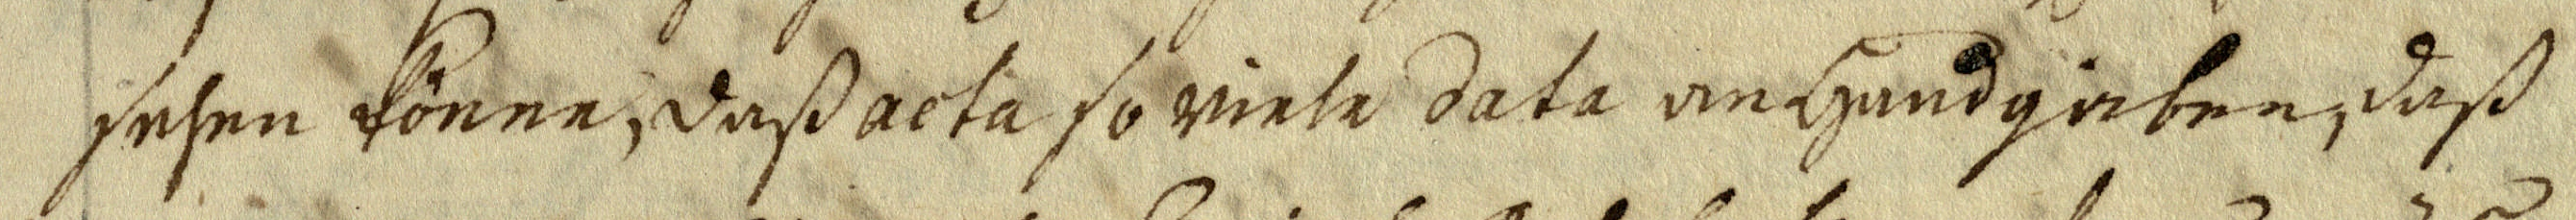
sehen könne, daß acta so viele data an Hand gäben, daß
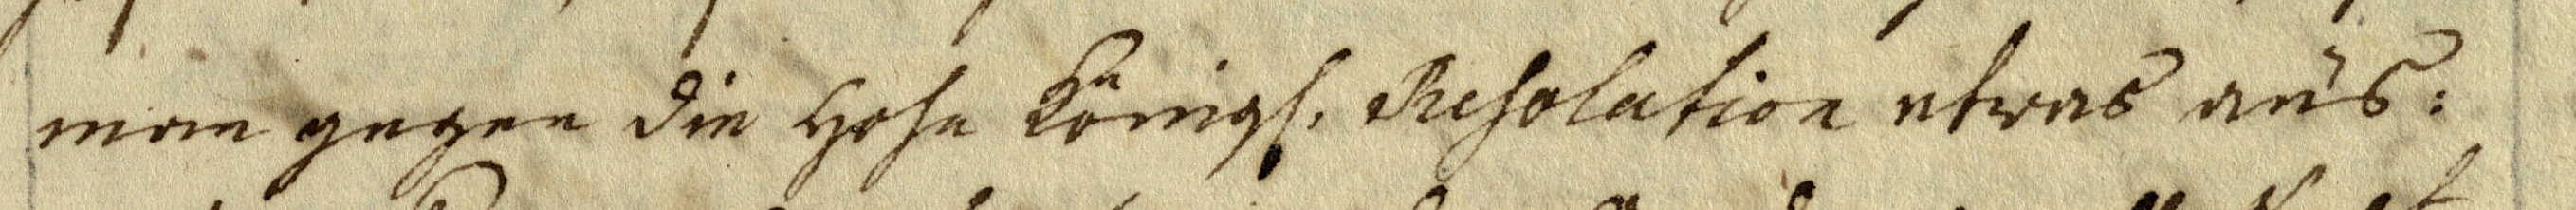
man gegen die Hohe Königl. Resolution etwas aus¬
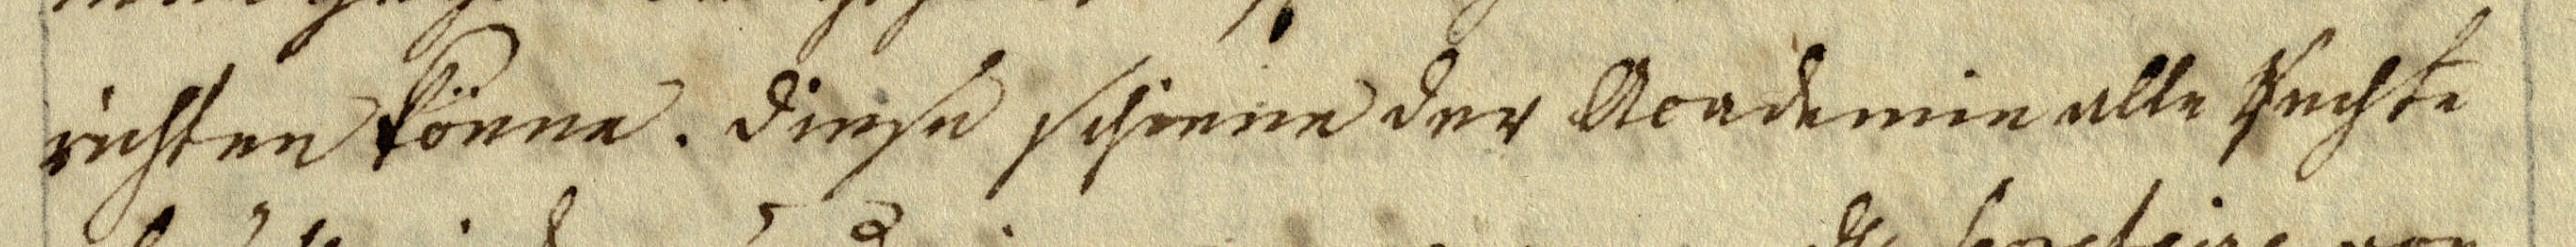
richten könne. Diese schiene der Academie alle Rechte
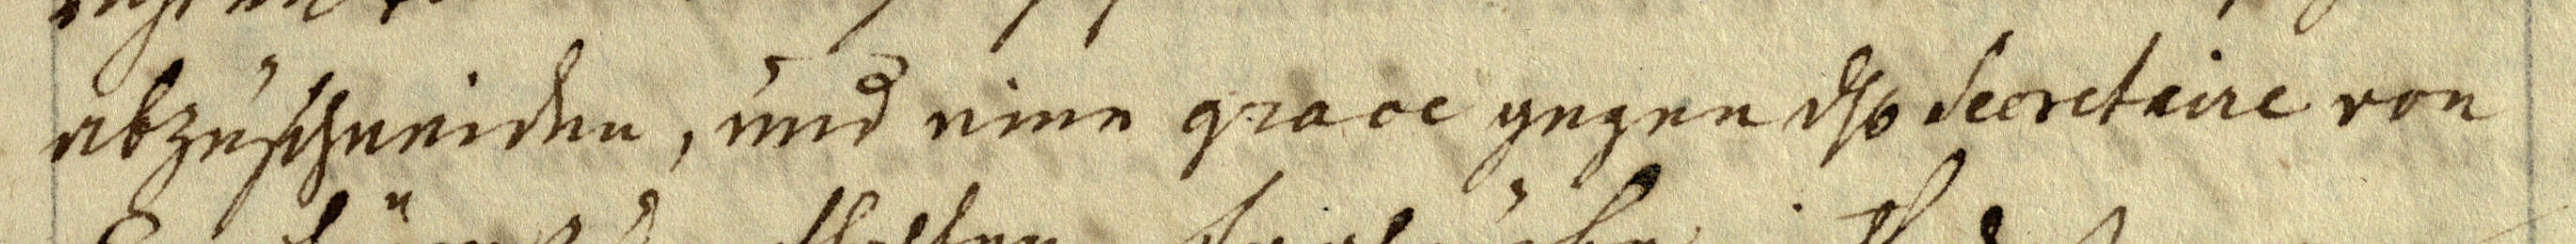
abzuschneiden, und eine grace gegen dh Secretaire von
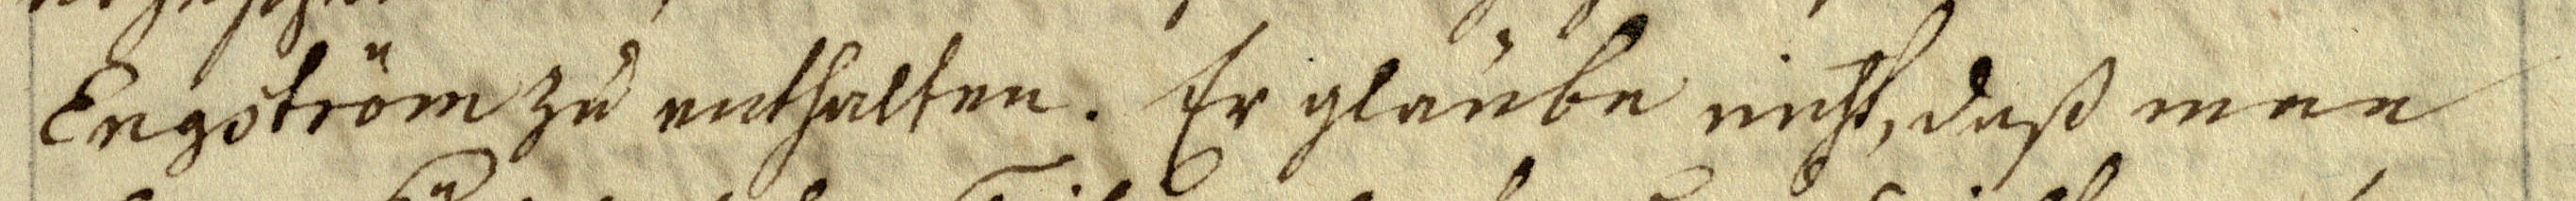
Engström zu enthalten. Er glaube nicht, daß man
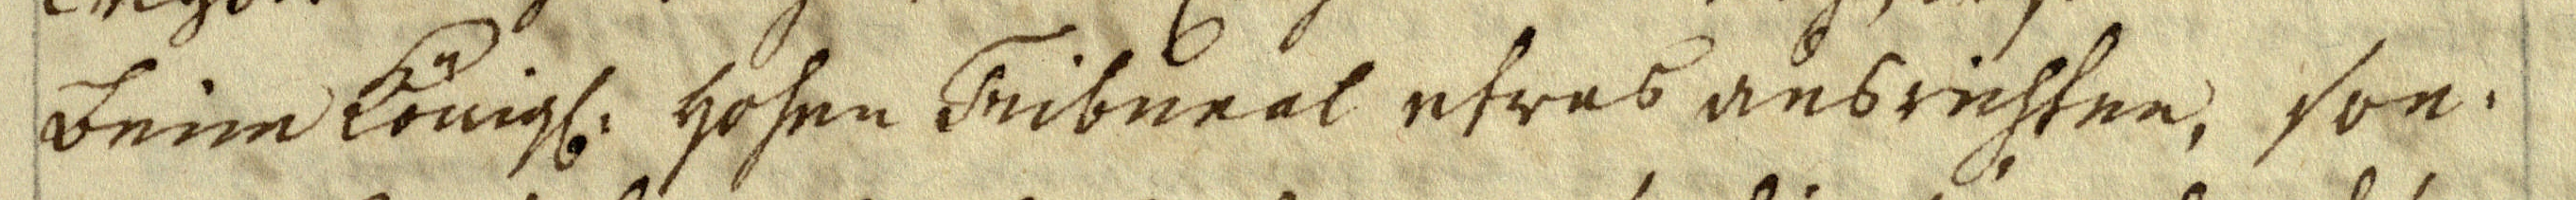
beim Königl. Hohen Tribunal etwas ausrichten, son¬
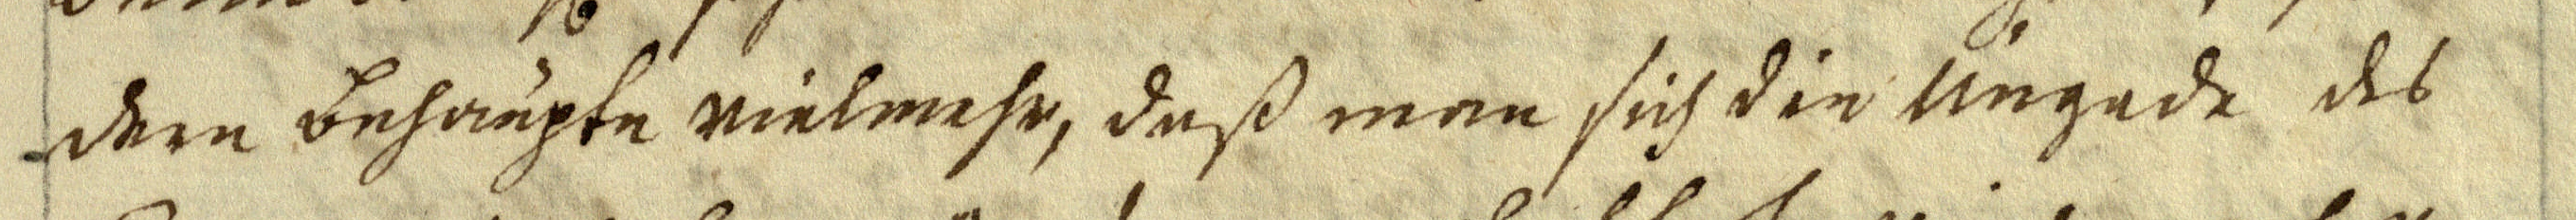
dern behaupte vielmehr, daß man sich die Ungade des
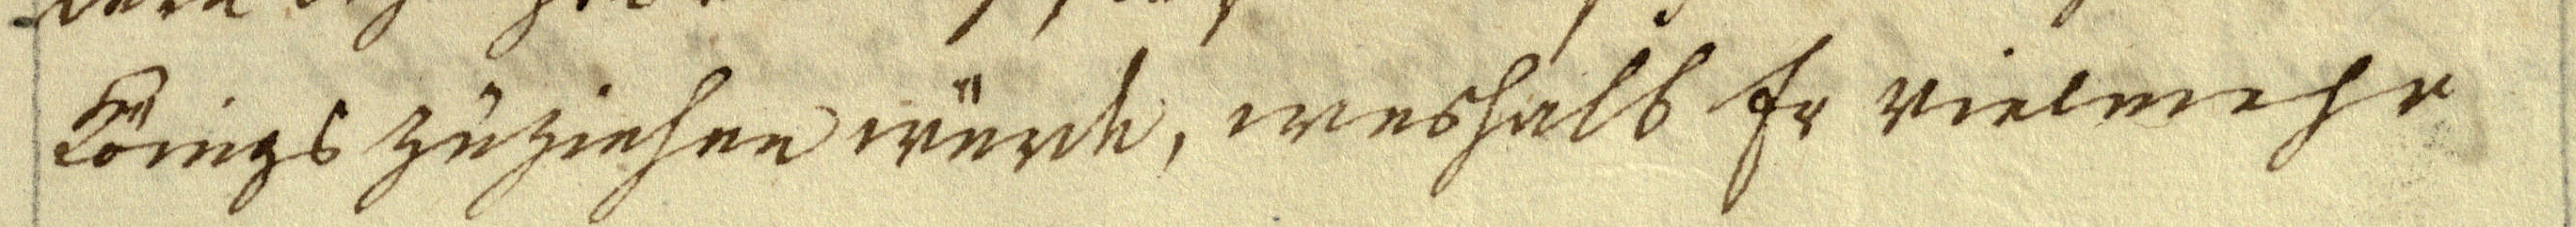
Königs zuziehen würde, weshalb Er vielmehr
